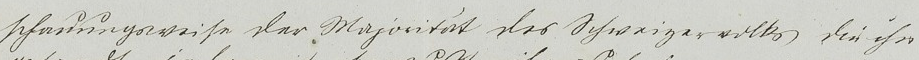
schauungsweise der Majorität des Schweizervolks die ihn
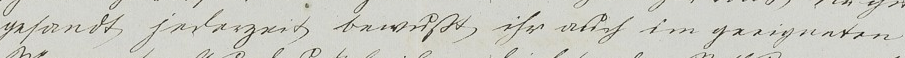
gesandt, jederzeit bewußt, ihr auch im geeigneten
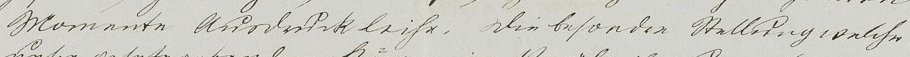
Momente Ausdruck leihe. Die besondre Stellung welche
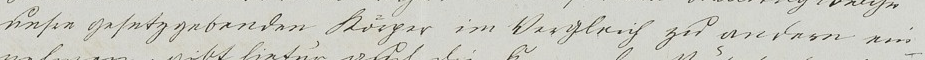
unsre gesetzgebenden Körper im Vergleich zu andern ein-
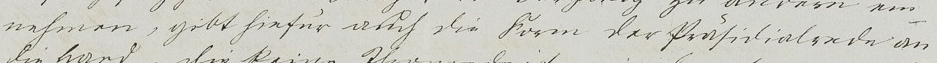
nehmen, gibt hiefür auch die Form der Präsidialrede an
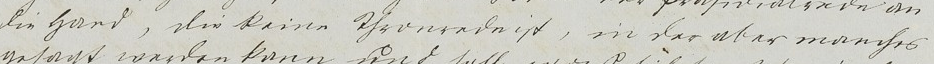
die Hand, die keine Thronrede ist, in der aber manches
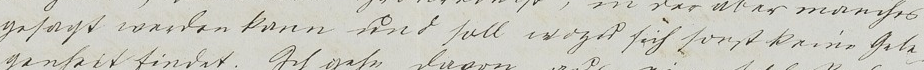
gesagt werden kann und soll wozu sich sonst keine Gele-
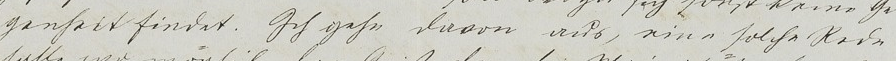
genheit findet. Ich gehe davon aus, eine solche Rede
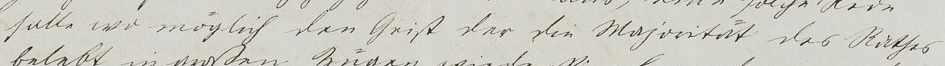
solle wo möglich den Geist der die Majorität des Rathes
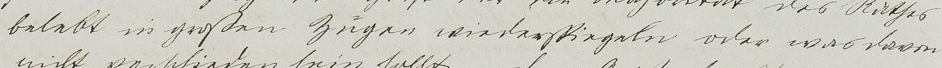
belebt in großen Zügen wiederspiegeln oder was davon
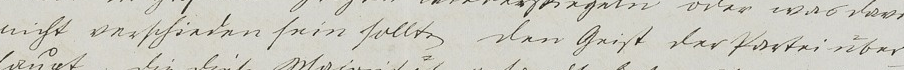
nicht verschieden sein sollte, den Geist der Partei über-
